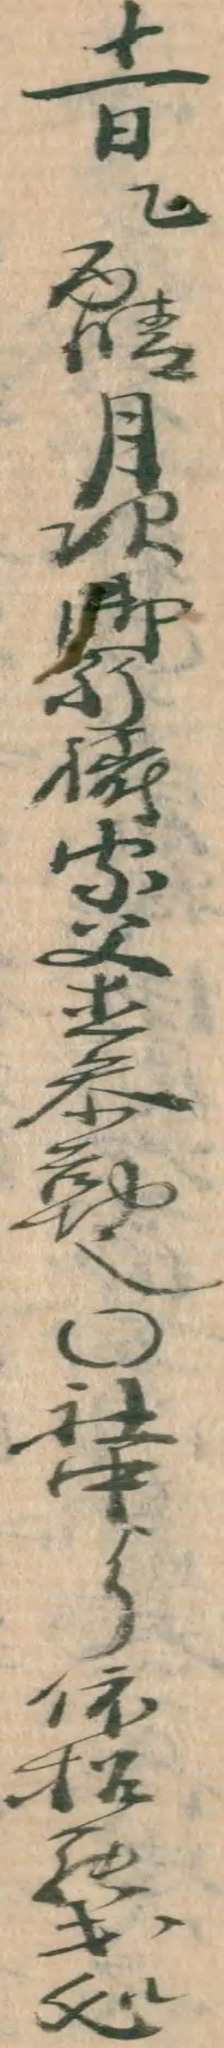十一日乙酉晴月次御祈祷家父直参勤也〇社中依松罷出処
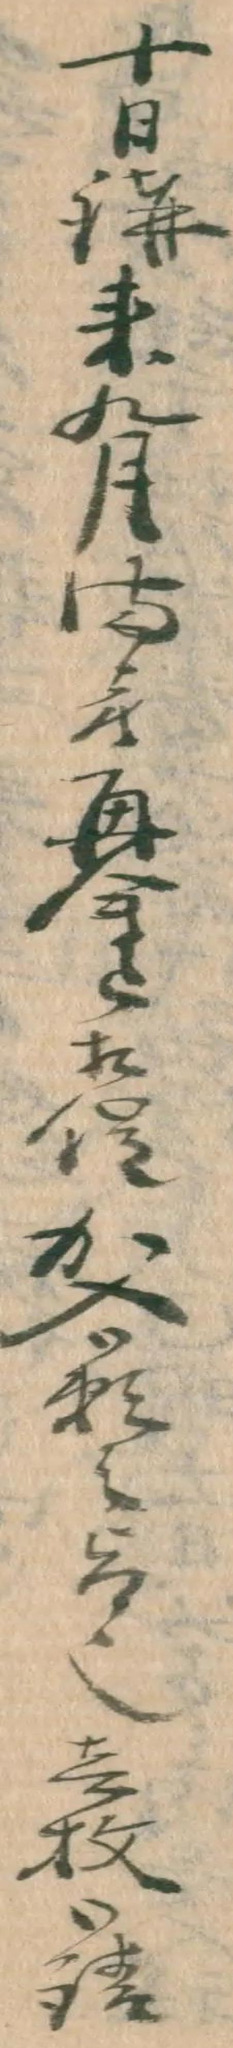十日講来九月満ニ付再會被相催加入御頼之旨也壱枚御請
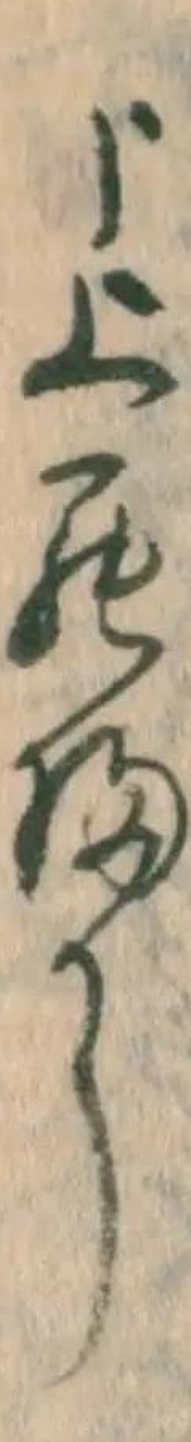申上罷帰了
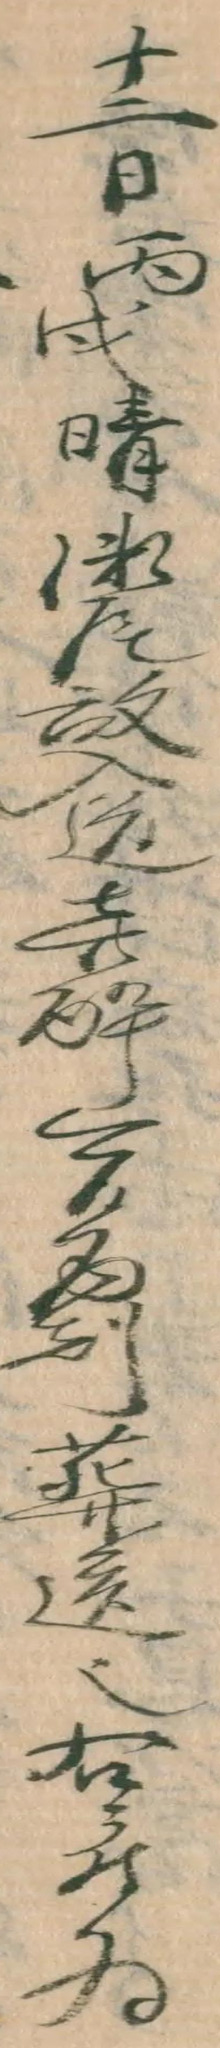十二日丙戌晴瀬尾故入道喜酔今日酉刻葬送也右ニ付為
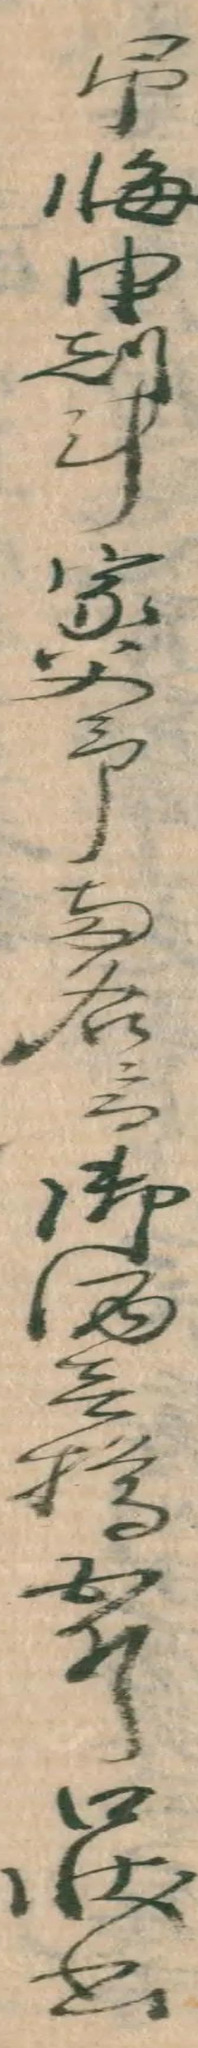弔悔申刻斗家父予両各ニ而御酒壱樽五升口伏書
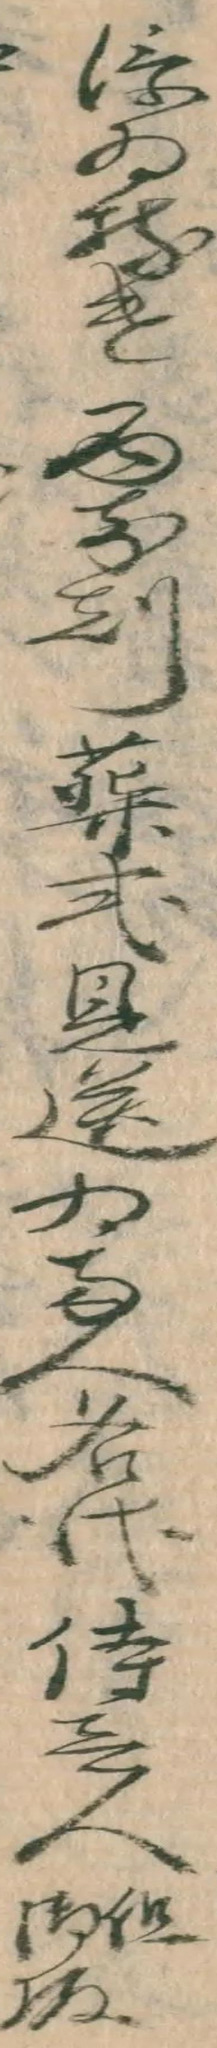添為持遣酉前刻葬式見送為両人各代侍壱人但視覚
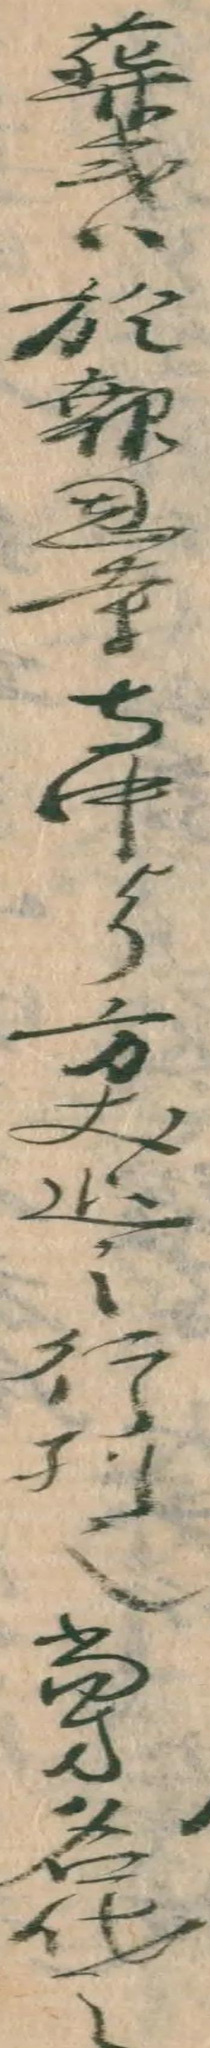葬式ハ於観恩寺寺中より方丈迄之行列也当方名代之
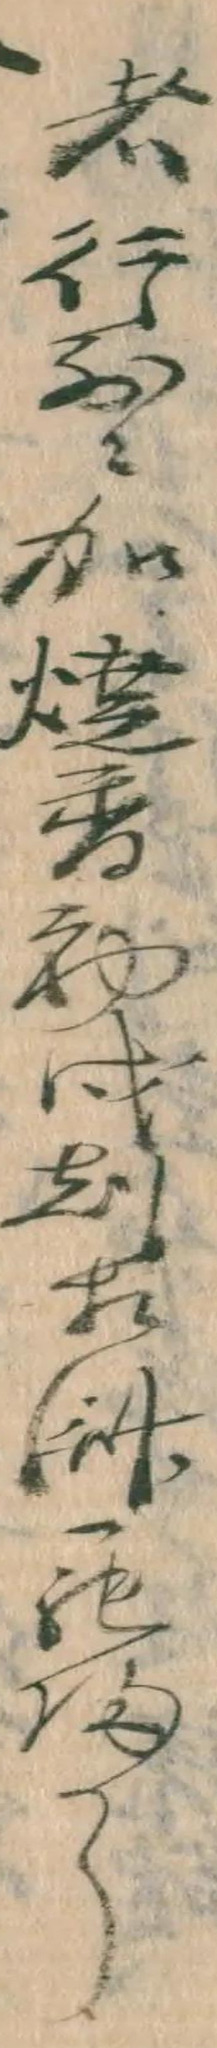者行別々加焼香初戌刻相済罷帰之
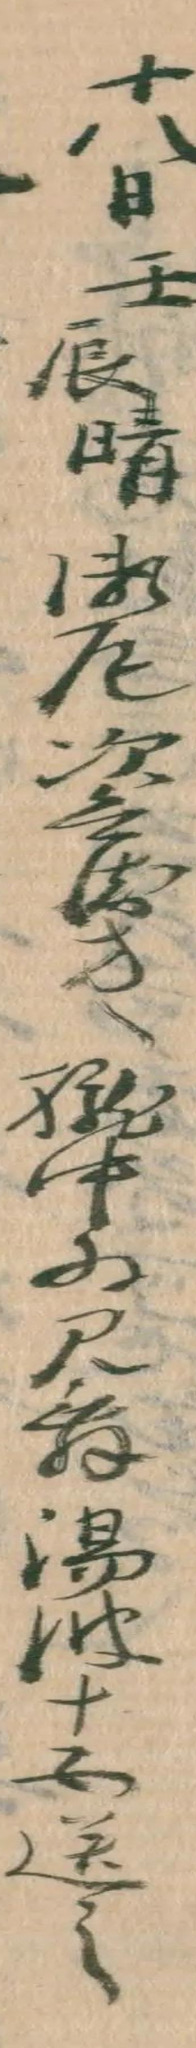十八日壬辰晴瀬尻次兵衛方へ就中為見舞湯波十五送之
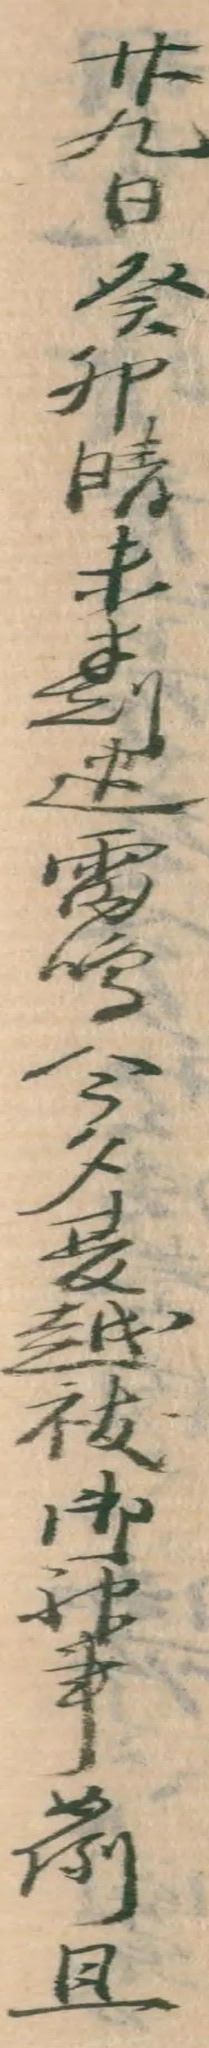廿九日癸卯晴未刻迄雷鳴今夕夏越枝御神事如例且
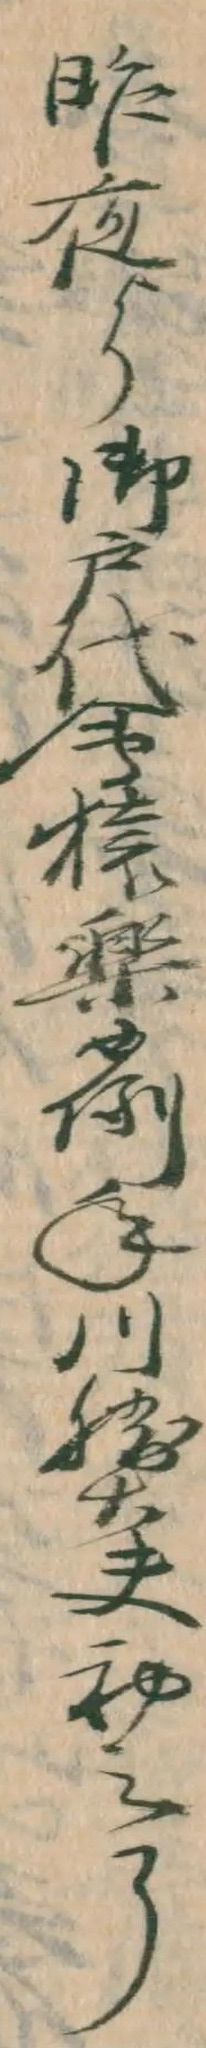昨夜より御戸代会猿楽如例年川勝大夫初之了
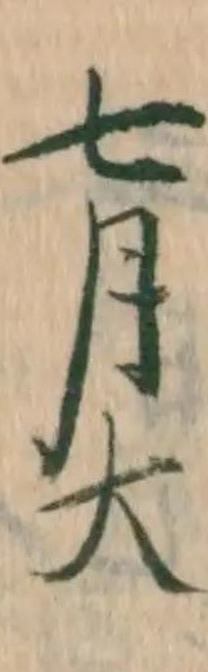七月大
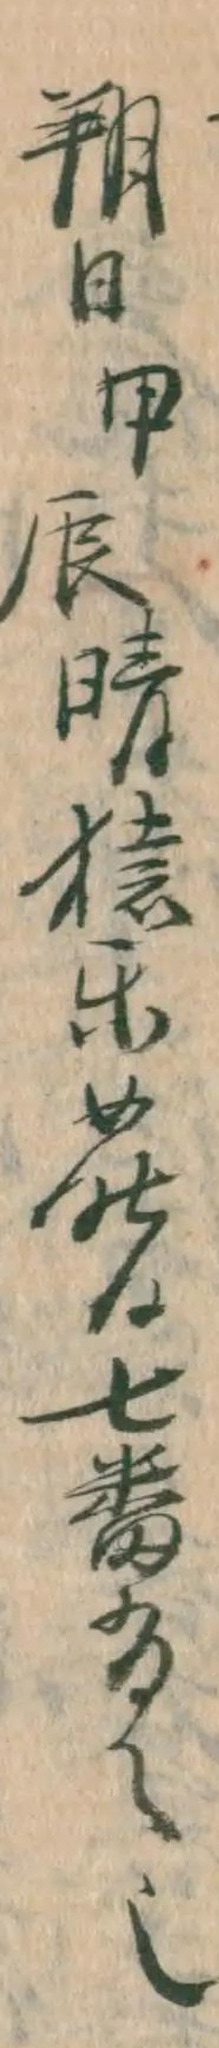朔日甲寅晴猿楽如昨日七番有之也
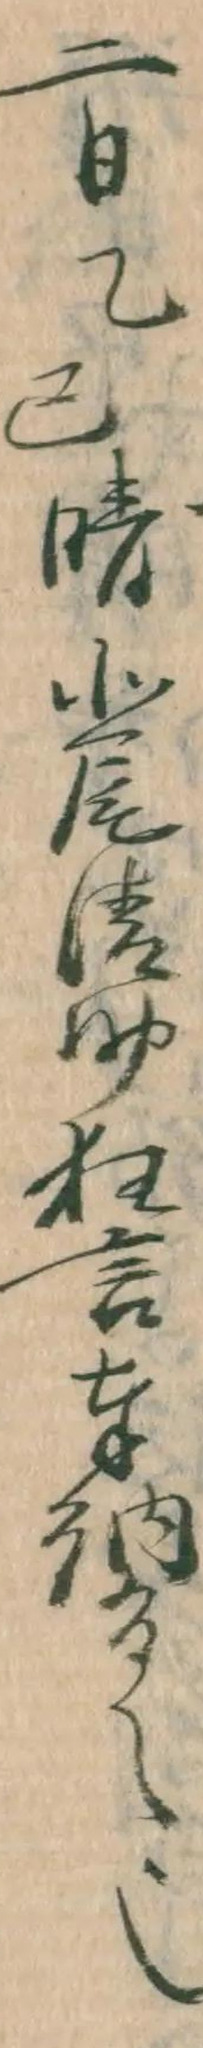二日乙巳晴北尾清助狂言奉納有之也
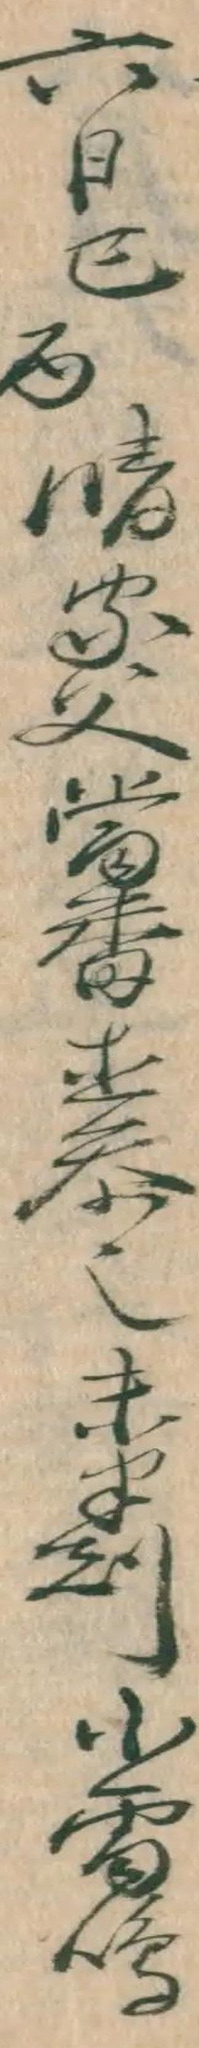六月己酉晴家父當番直参也未半刻小雷鳴
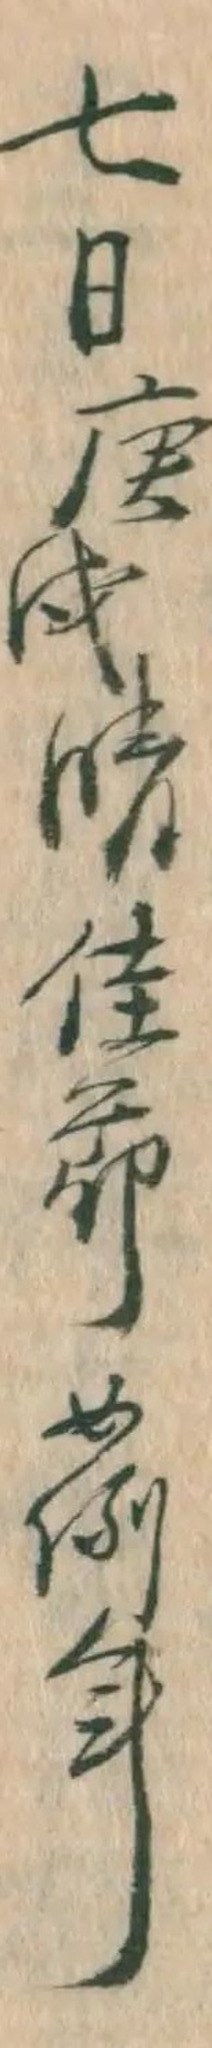七日庚戌晴佳節如例年
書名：賀茂社記録. 第65冊
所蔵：国立国会図書館 National Diet Library, JAPAN
